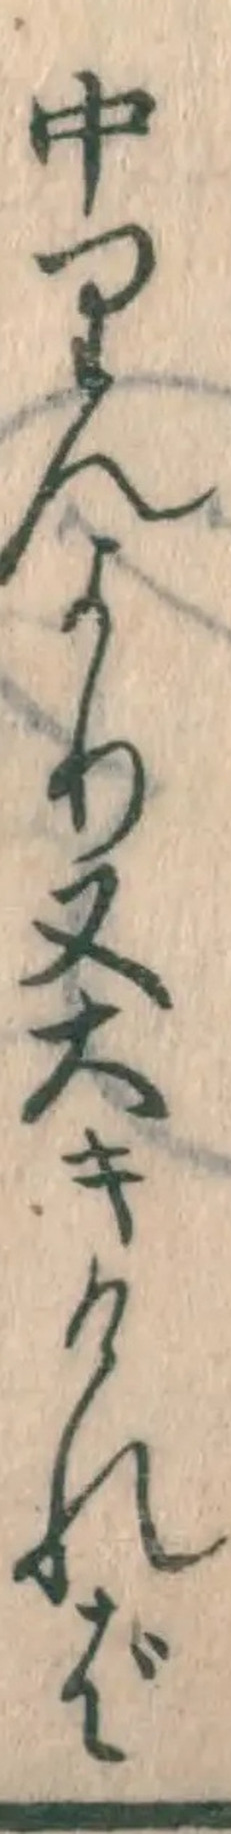中りんより又多きければ
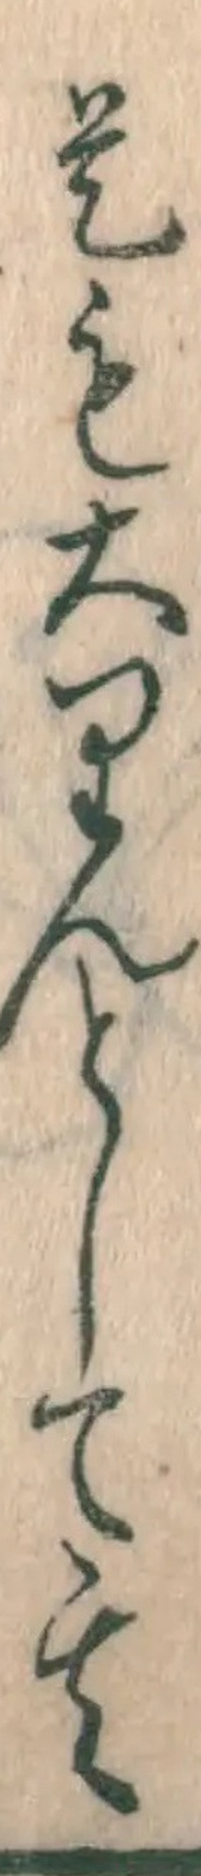是を大りんとして其
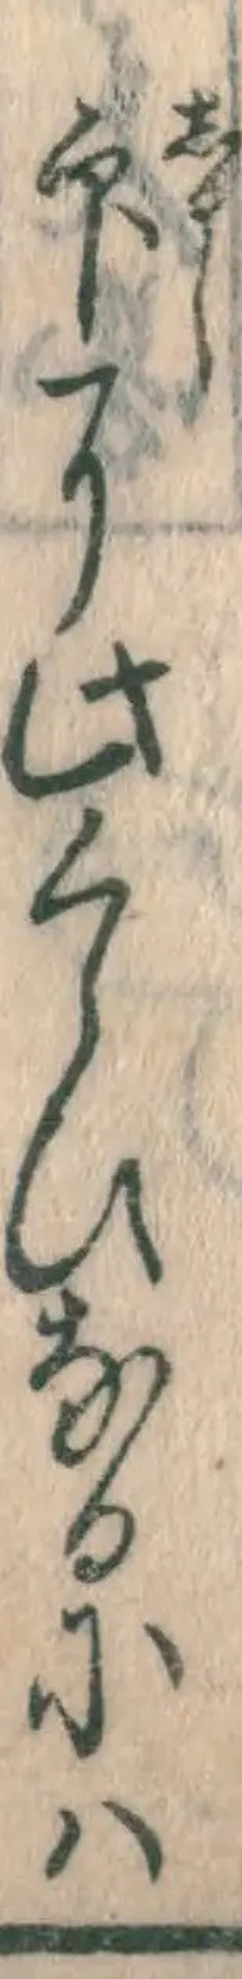印に此くらひなるには
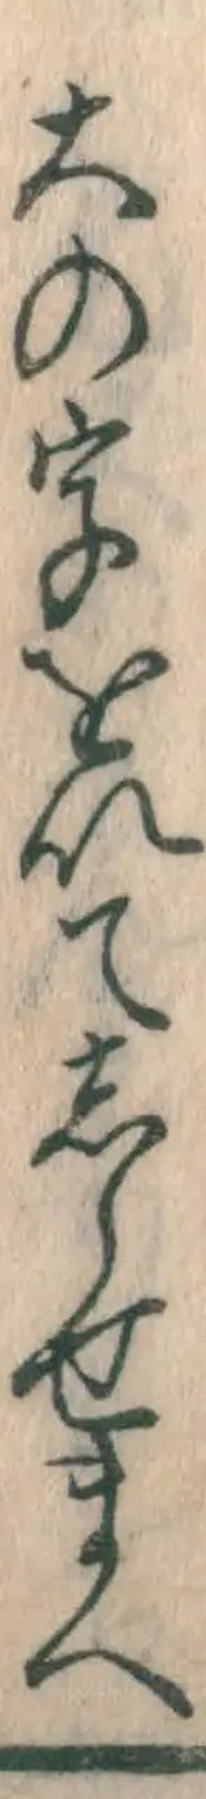大の字を以てしらせまへ
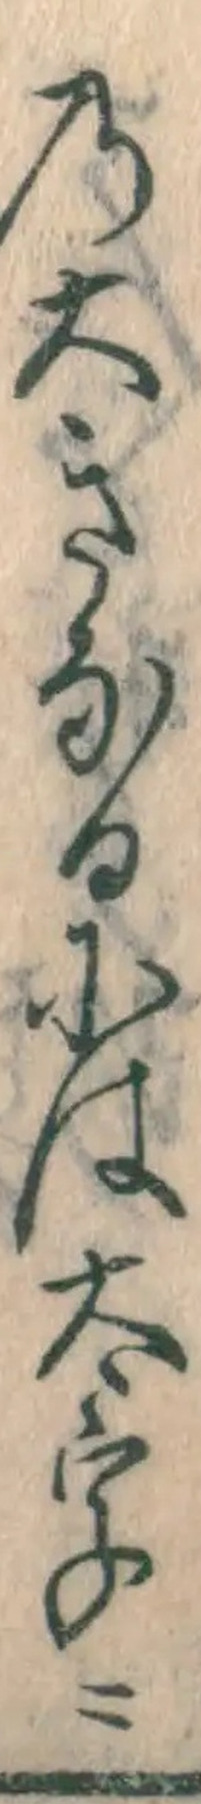の大きなるには太字に

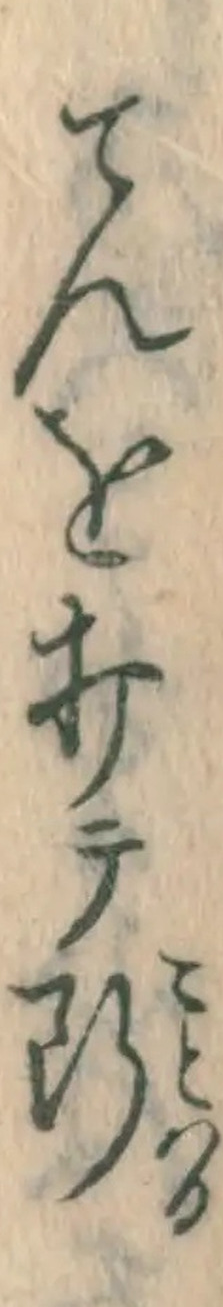てんを打て断
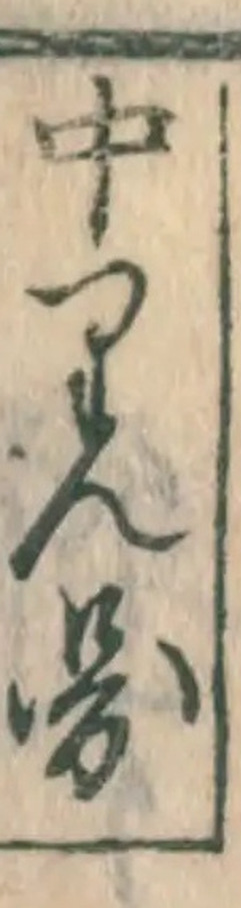中りん図
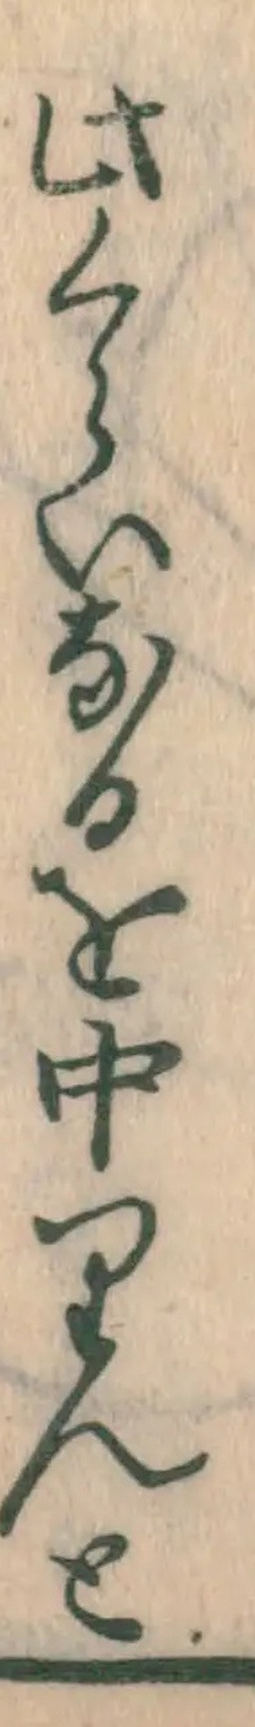此くらいなるを中りんと
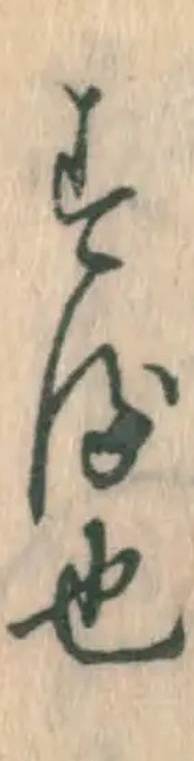する也
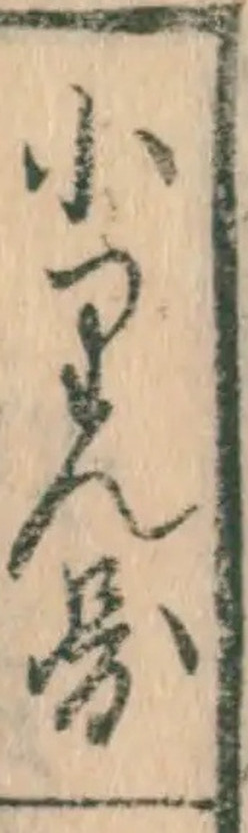小りん図
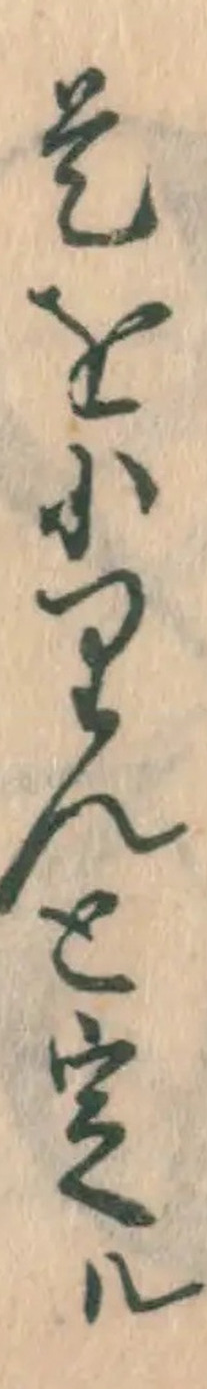是を小りんと定る
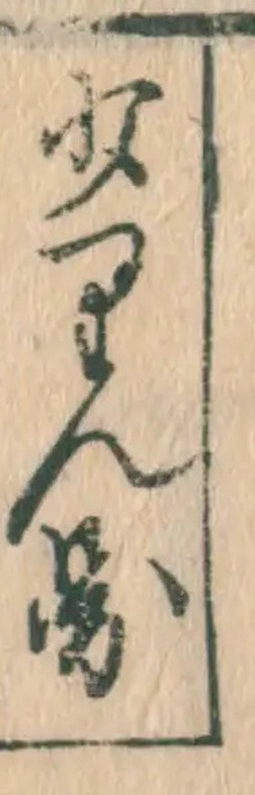少りん図
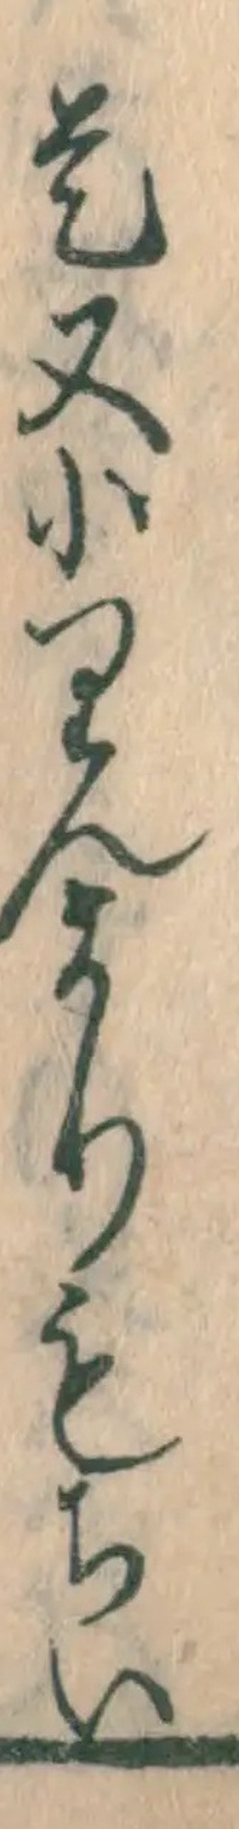是又小りんよりもちい
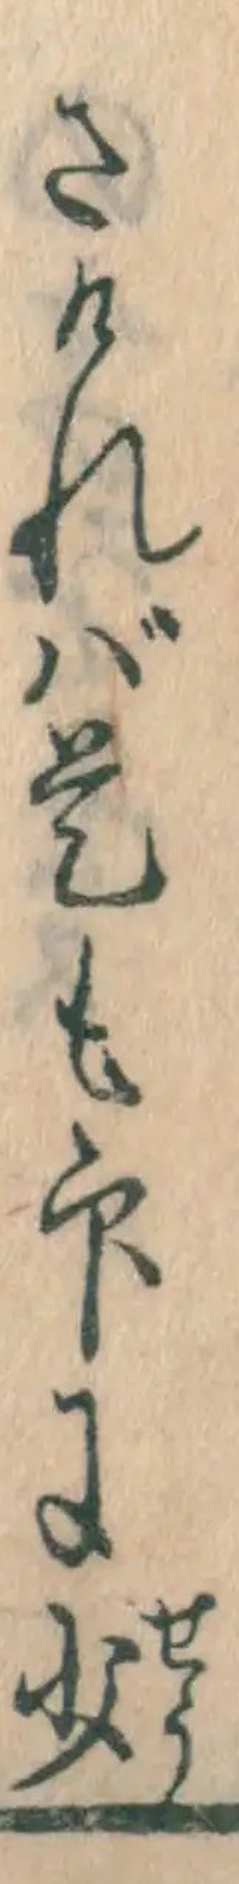さければ是も印に少

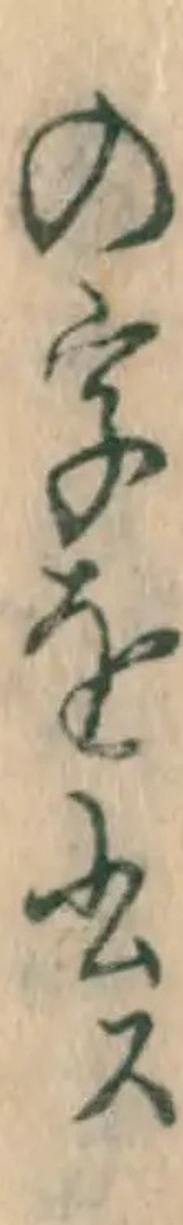の字を書す
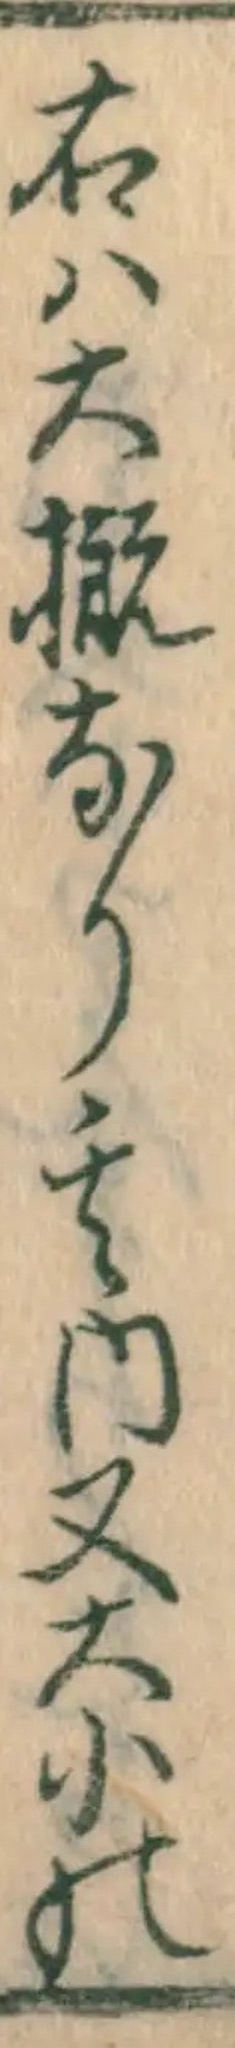右は大概なり其門又大小の
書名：錦繍枕 5巻. [1]
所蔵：国立国会図書館 National Diet Library, JAPAN
